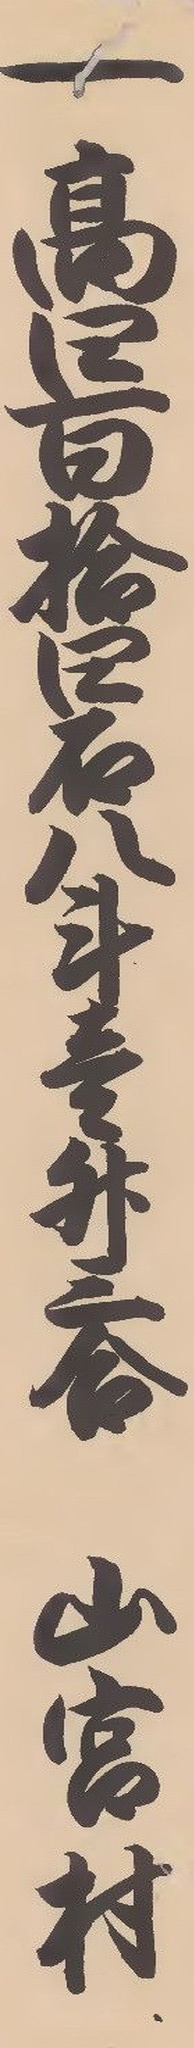一高四百拾四石八斗壱升三合山宮村
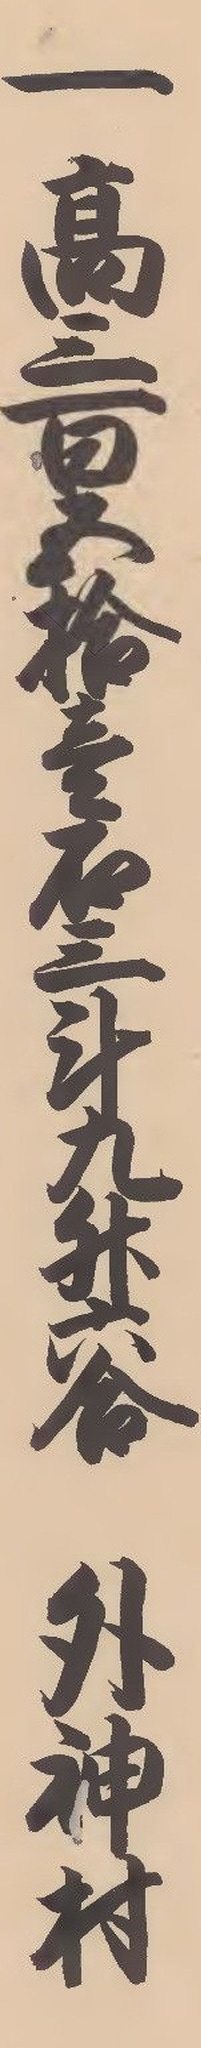一高三百五拾壱石三斗九升六合外神村
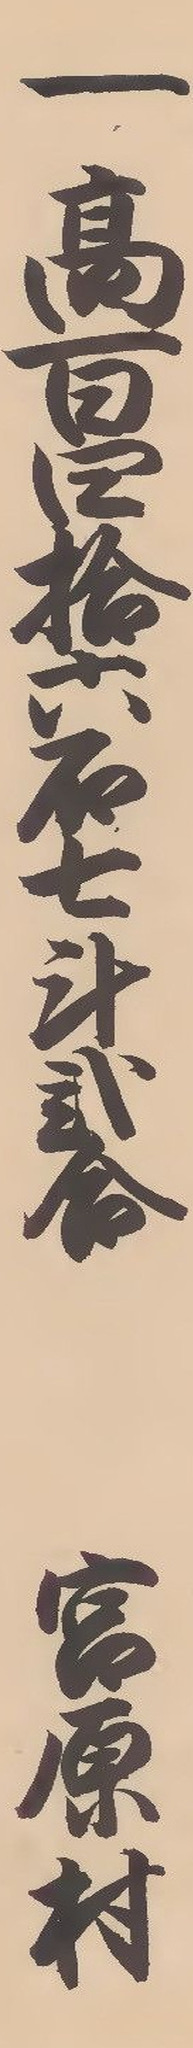一高百四拾六石七斗弐合宮原村
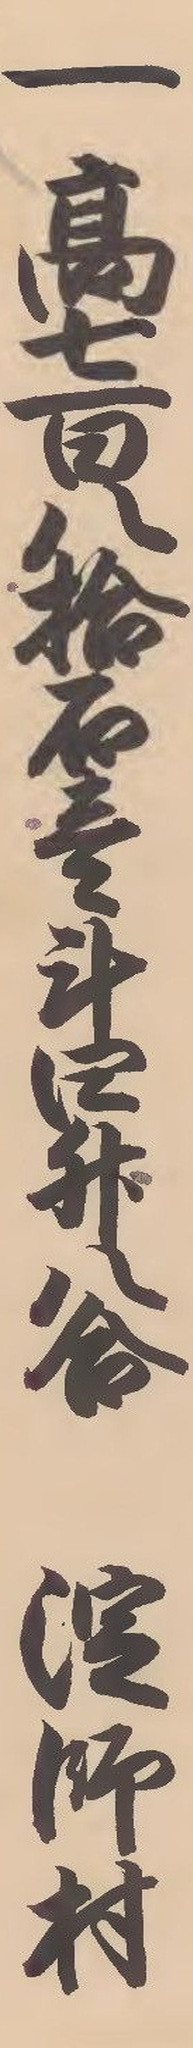一高七百八拾石壱斗四升八合淀師村

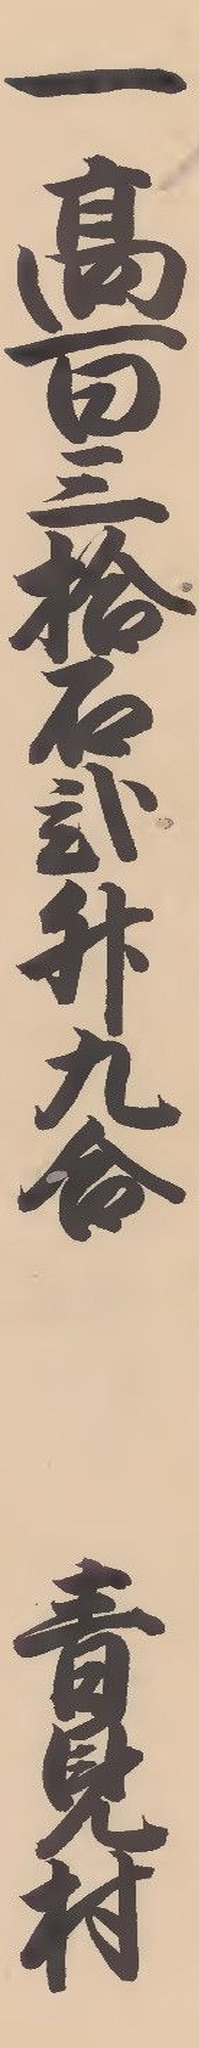一高百三拾石弐升九合青見村
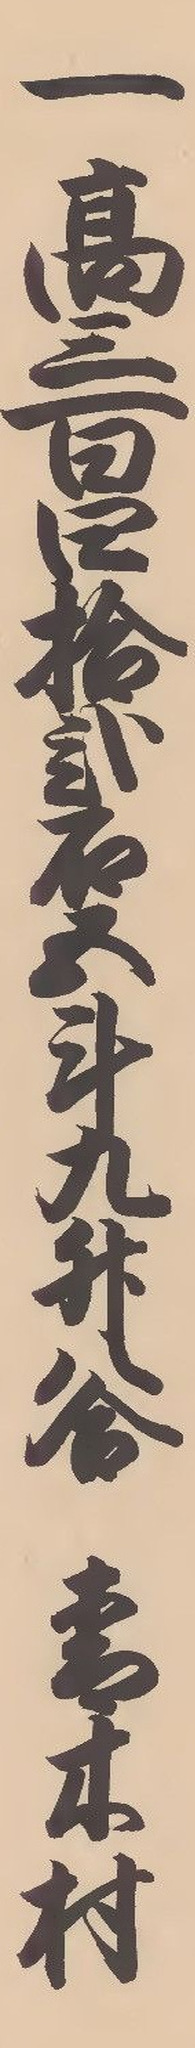一高三百四拾弐石五斗九升八合青木村
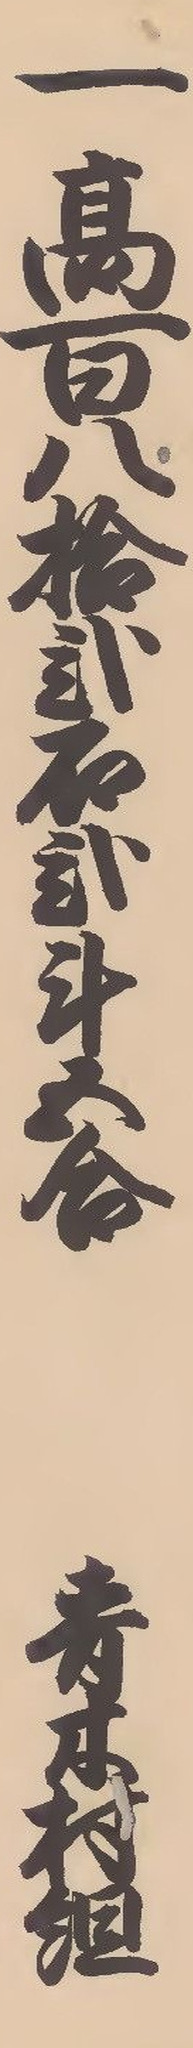一高百八拾弐石弐斗五合青木村組
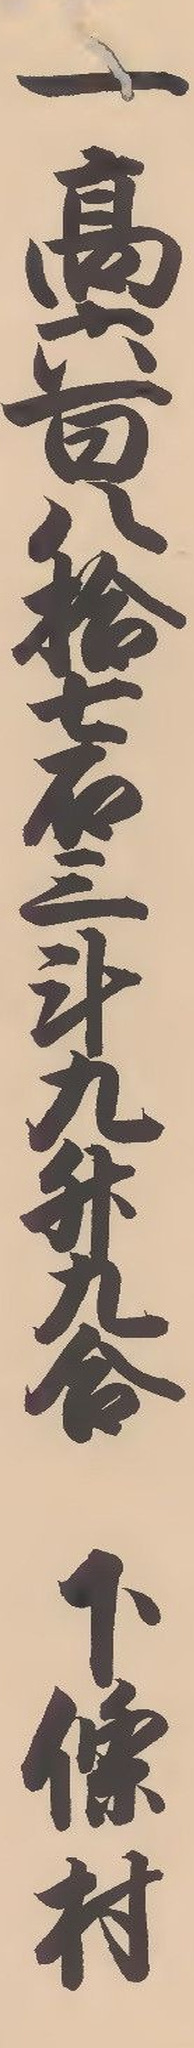一高六百八拾七石三斗九升九合下条村
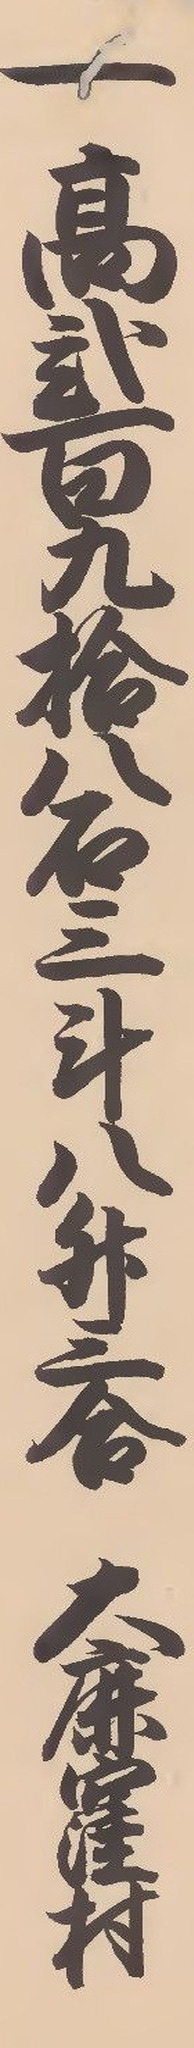一高弐百九拾八石三斗八升三合大鹿窪村
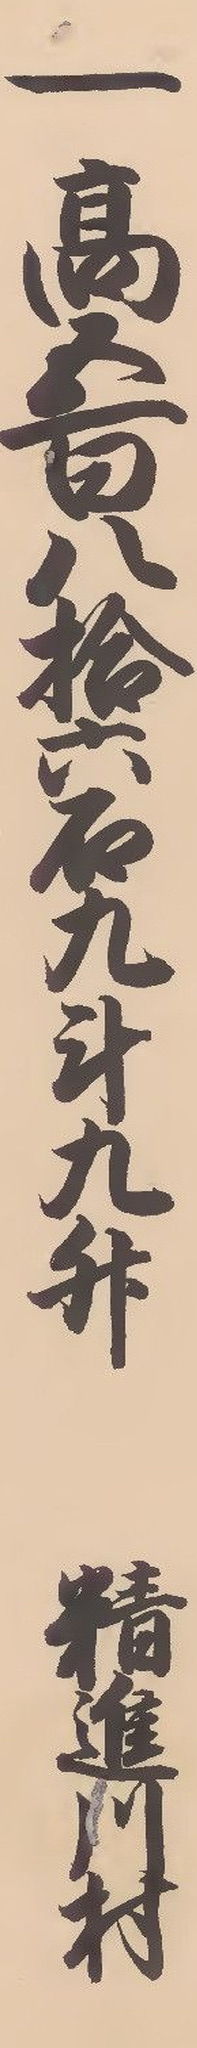一高五百八拾六石九斗九升精進川村
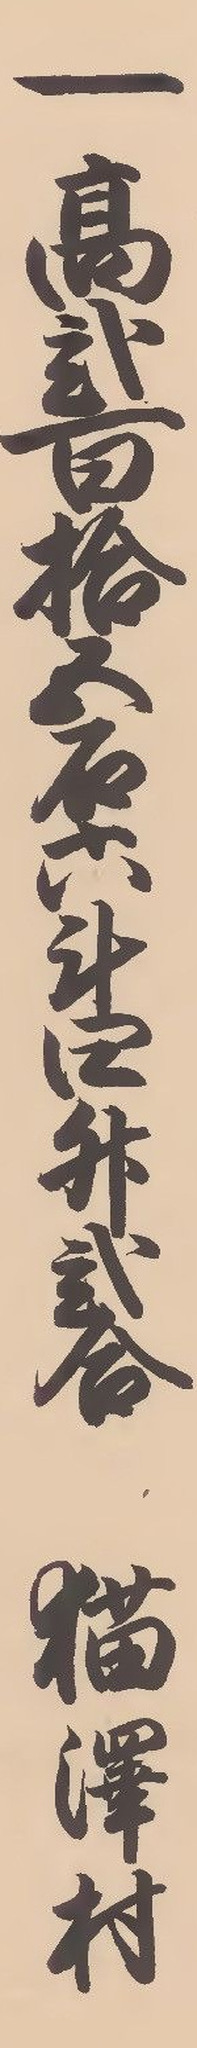一高弐百拾五石六斗四升弐合猫沢村
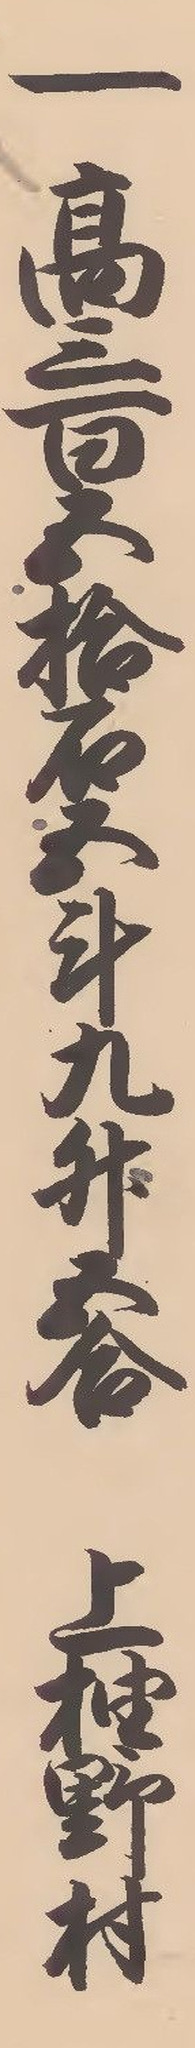一高三百五拾石五斗九升五合上柚野村

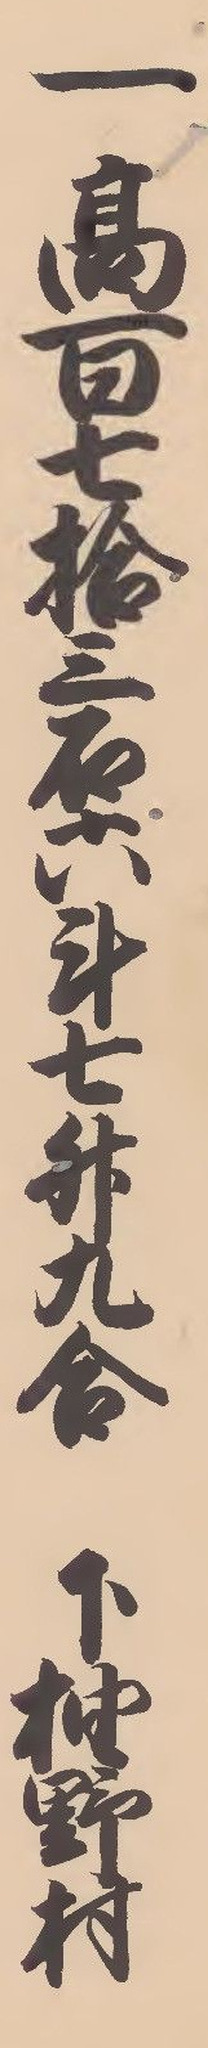一高百七拾三石六斗七升九合下柚野村
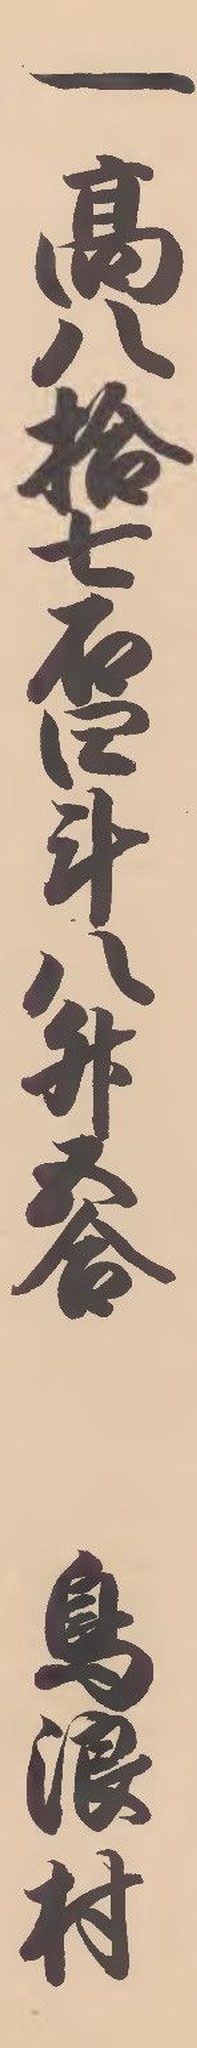一高八拾七石四斗八升五合鳥浪村
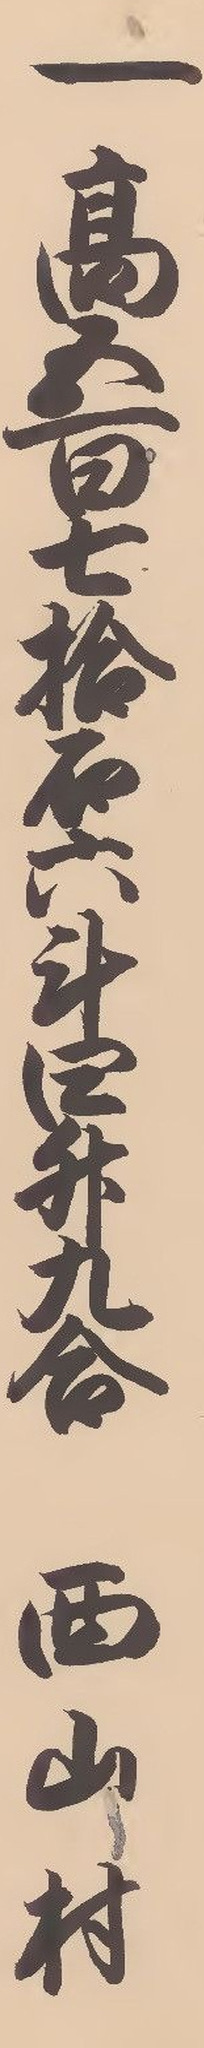一高五百七拾石六斗四升九合西山村
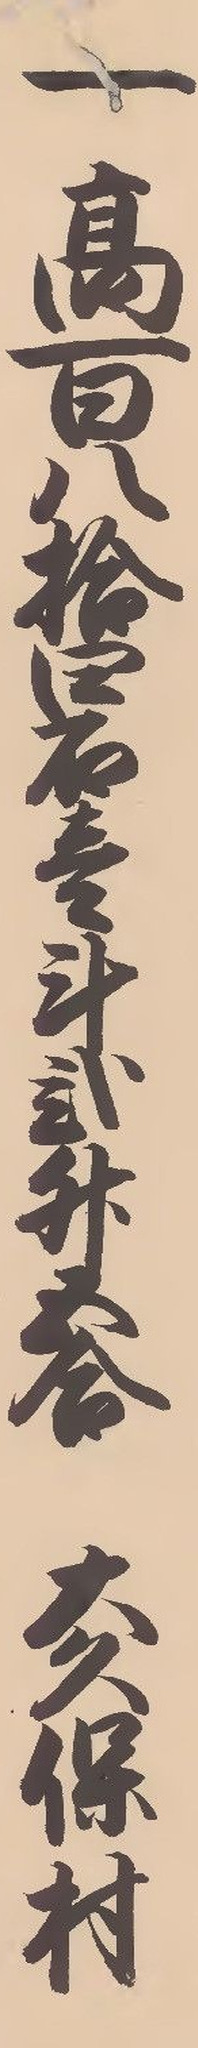一高百八拾四石壱斗弐升五合大久保村
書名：駿河国郷帳
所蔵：国立公文書館 National Archives of Japan
